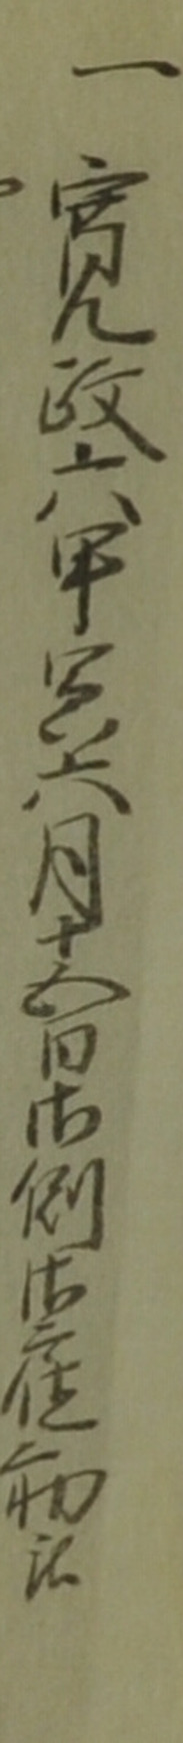一寛政六甲寅閏六月十五日御側御雇勤被
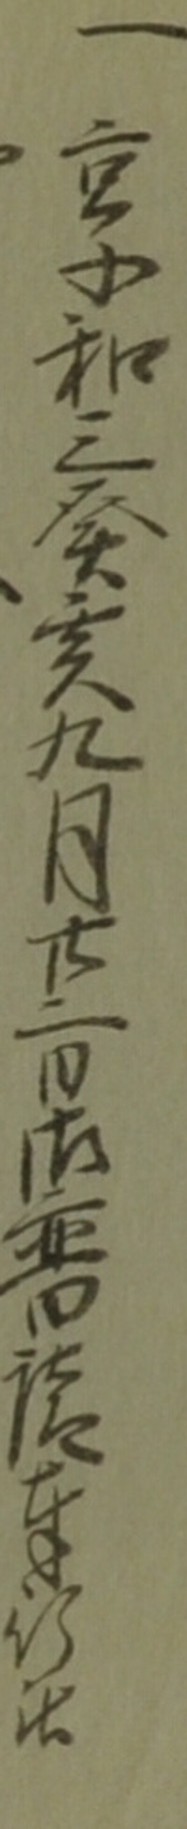一享和三癸亥九月廿二日御普請奉行被
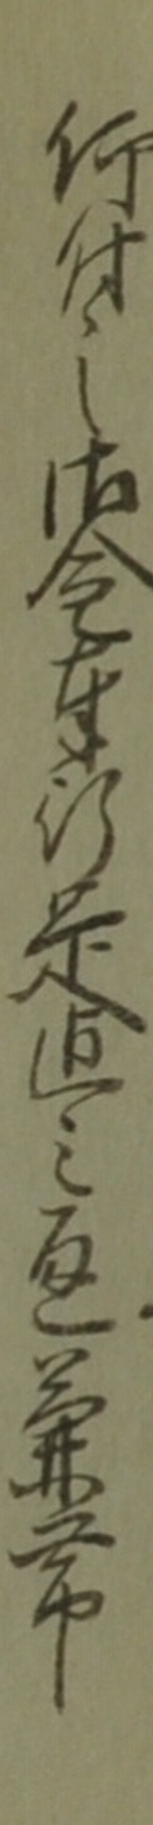仰付之御金奉行是迄之通兼帯
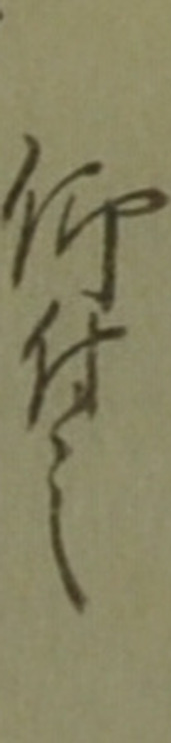仰付之
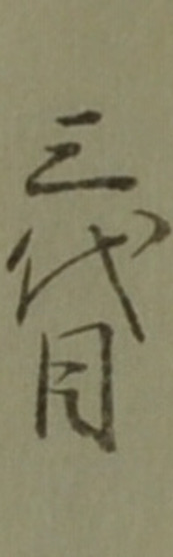三代目
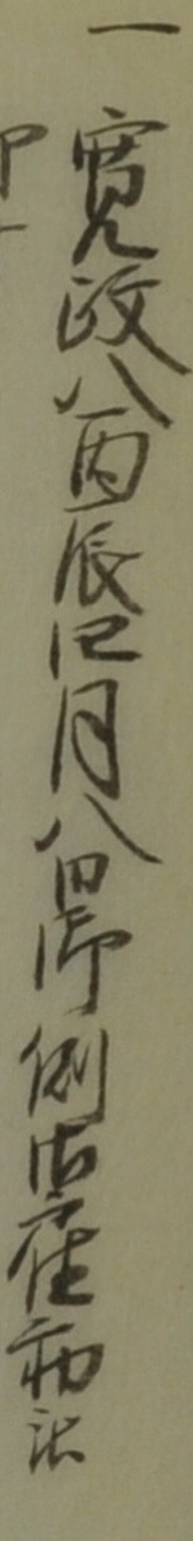一寛政八丙辰四月八日御側御雇勤仕被
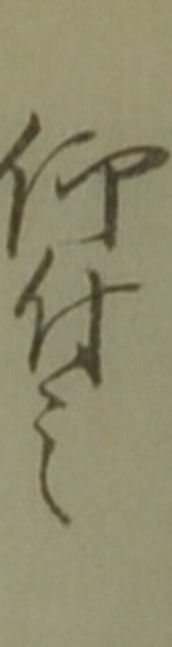仰付之
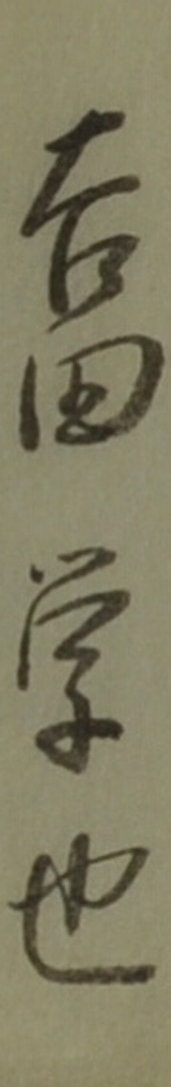吉田学也
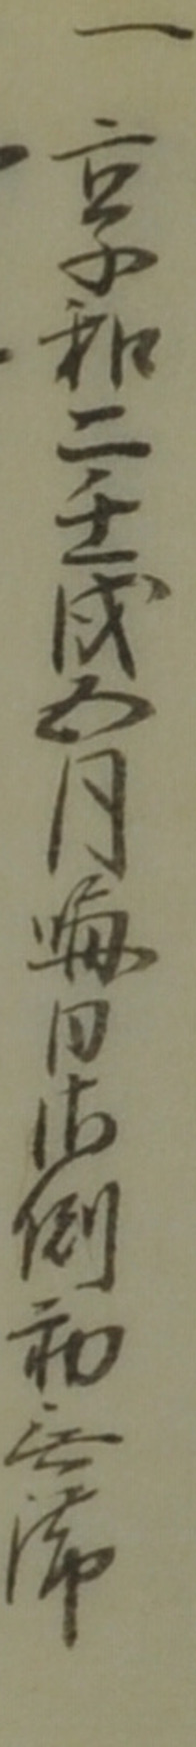一享和二壬戌五月晦日御側勤無滞
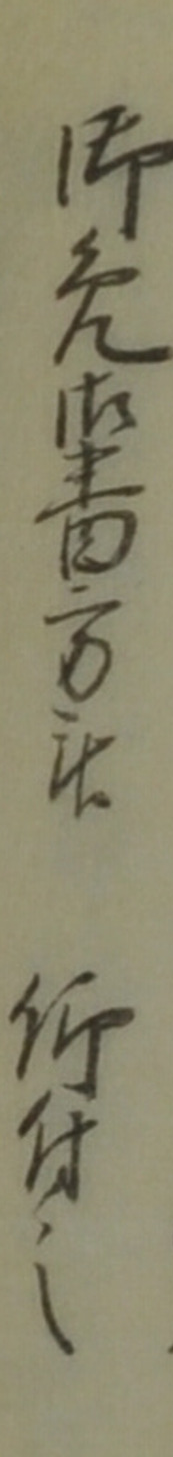御免御番方被仰付之
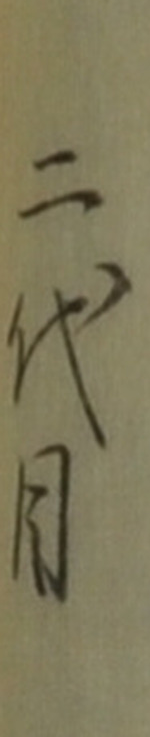二代目
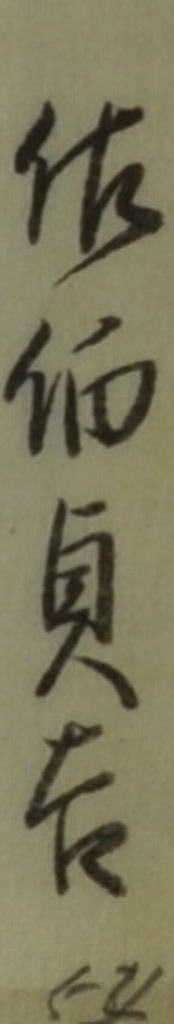佐伯貞吉
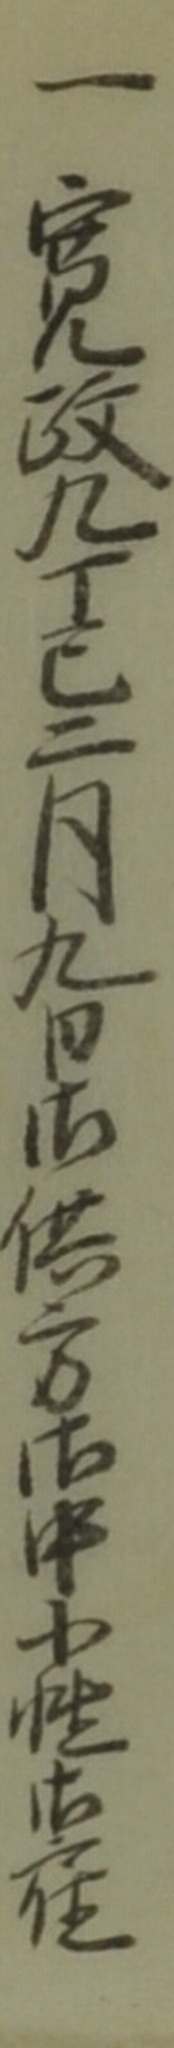一寛政九丁巳二月九日御供方御中小性御雇
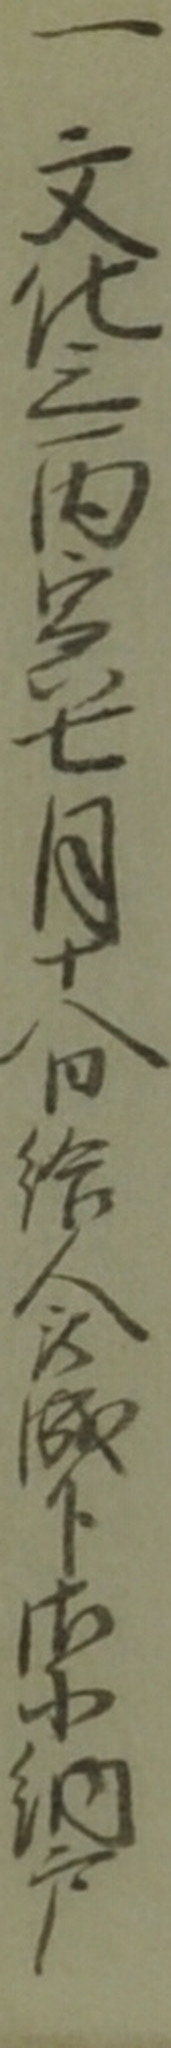一文化三丙寅七月十八日給人被成下御小納戸
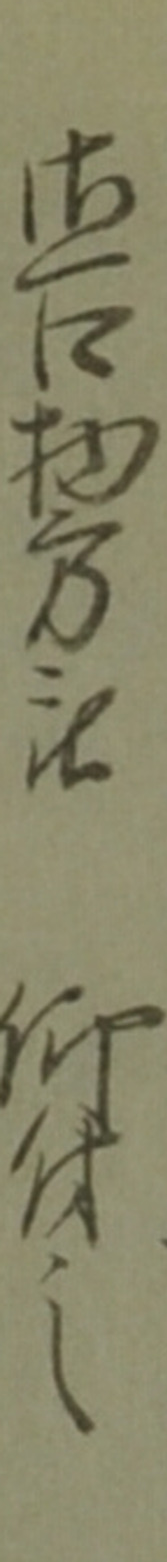御召物方被仰付之
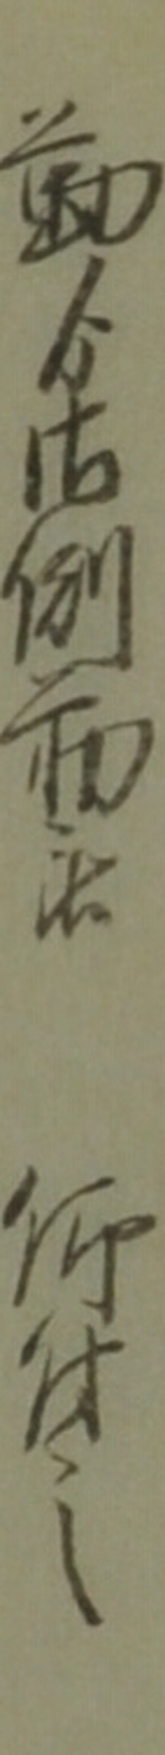勤ゟ御側勤被仰付之
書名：諸御役代々録（五）
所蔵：伊那市立高遠町図書館・合同会社AMANE
